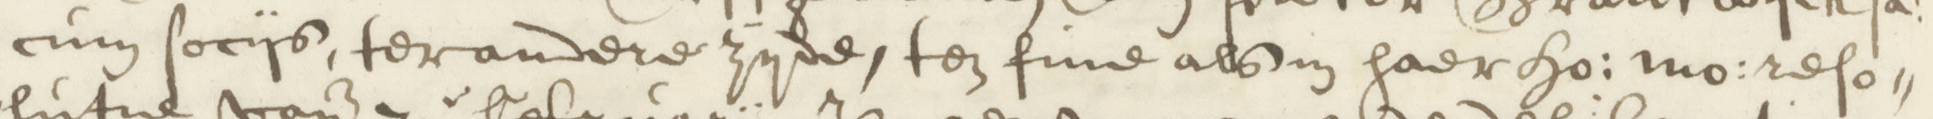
cum socijs, ter andere zijde, ten fine als in haer Ho:Mo: reso„
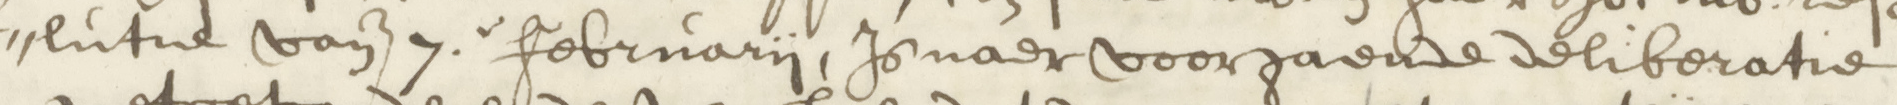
lutie vand. 7e februarij, Is naer voorgaende deliberatie
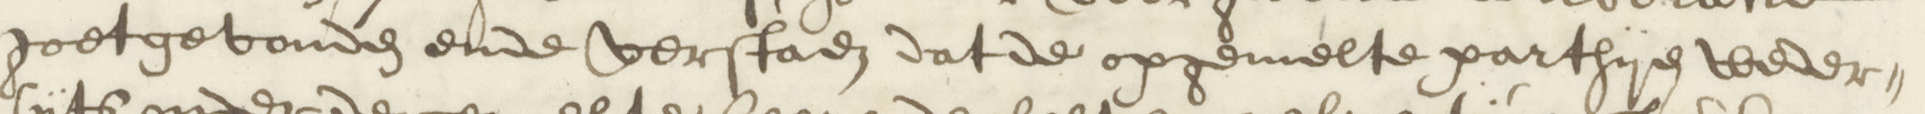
goetgevonden ende verstaen dat de opgemelte parthijen weder„
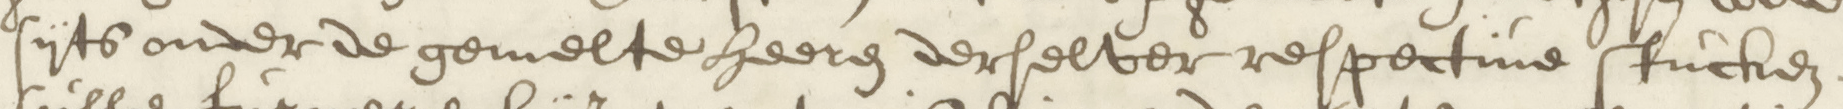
sijts onder de gemelte heeren derselver respectiue stucken
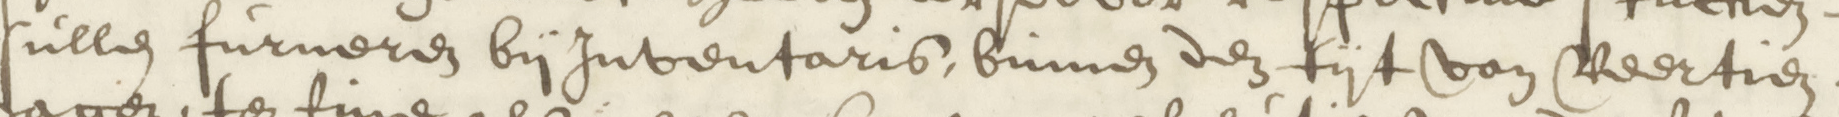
sullen furneren bij inventaris, binnen den tijt van veertien
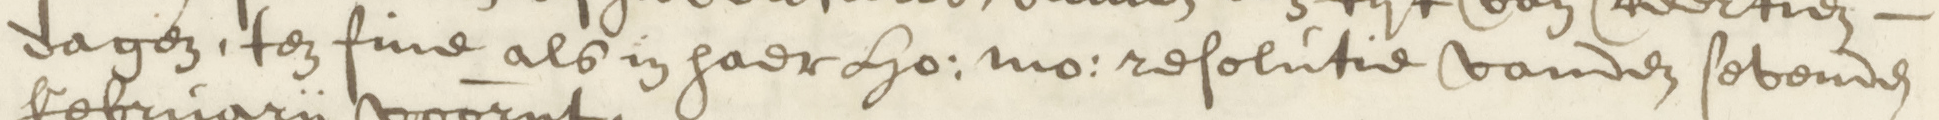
dagen, ten fine als in haer Ho:Mo: resolutie vanden sevenden
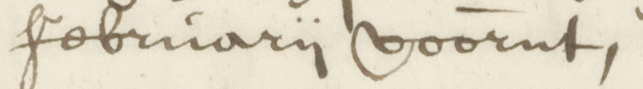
februarij voornt.
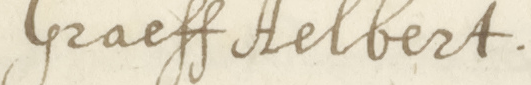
Graeff Aelbert
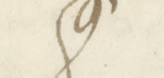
ca
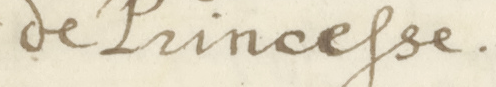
de Princesse
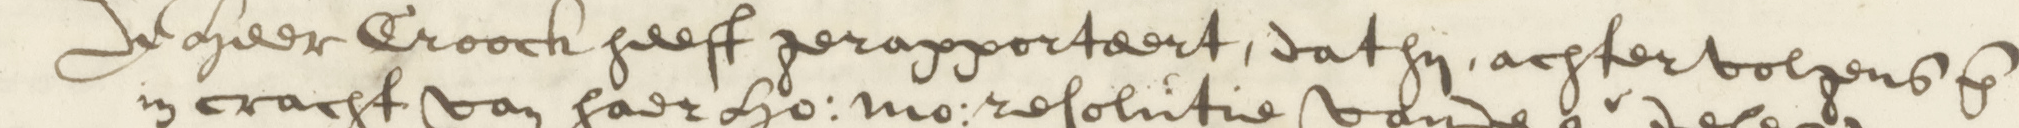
De heer Croock heeft gerapporteert, dat hij achtervolgens &
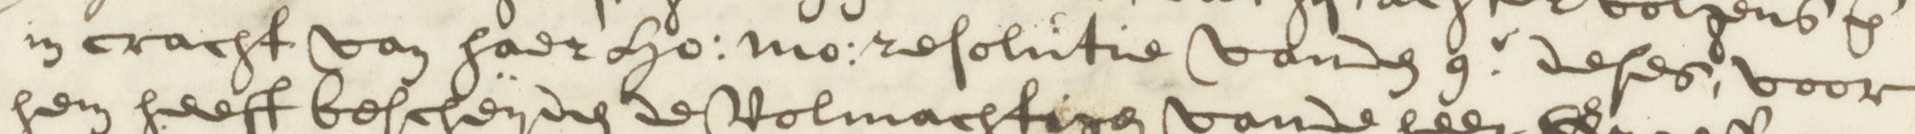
in cracht van haer Ho:Mo: resolutie vanden 9e. deses, voor
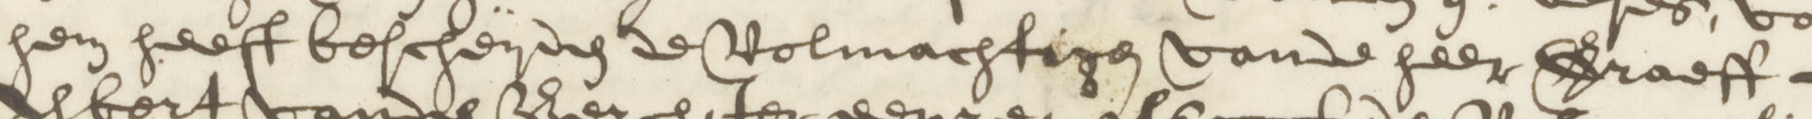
hem heeft bescheijden de volmachtigen vande heer Graeff
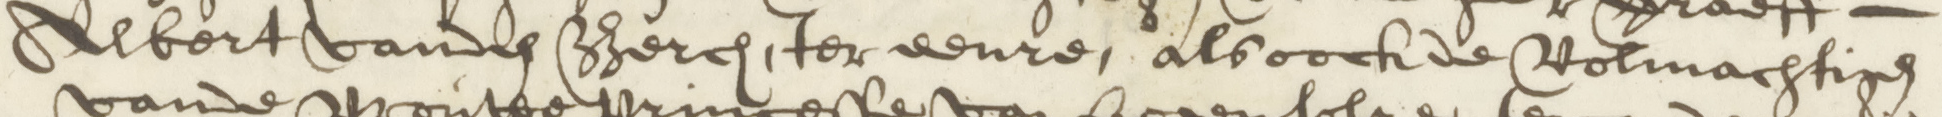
Albert van den Berch, ter eenre, als oock de volmachtigen
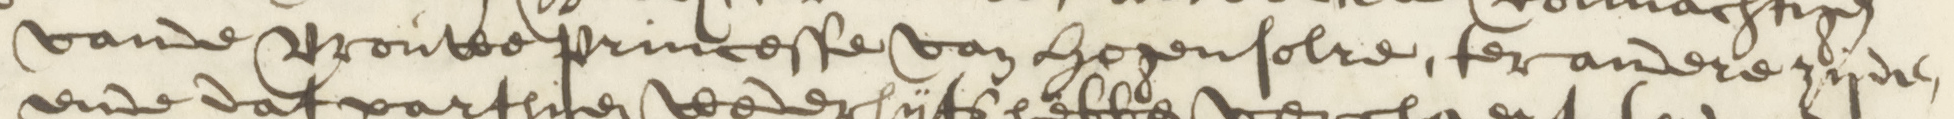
van de vrouwe princesse van Hogensolre, ter andere zijde
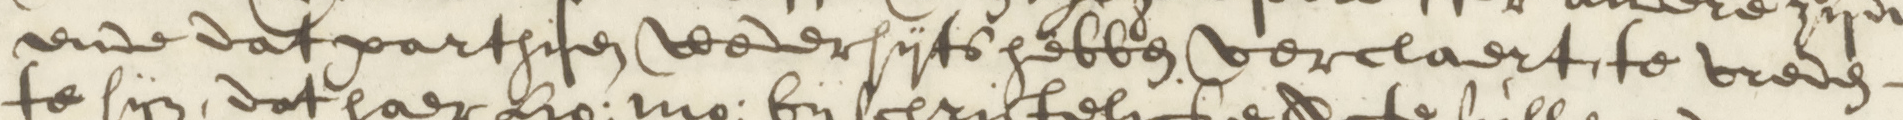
ende dat parthien wedersijts hebben verclaert, te vreden
